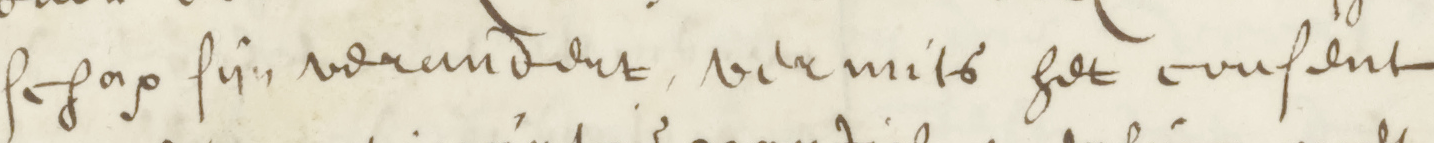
schap sijn verandert, vermits het consent
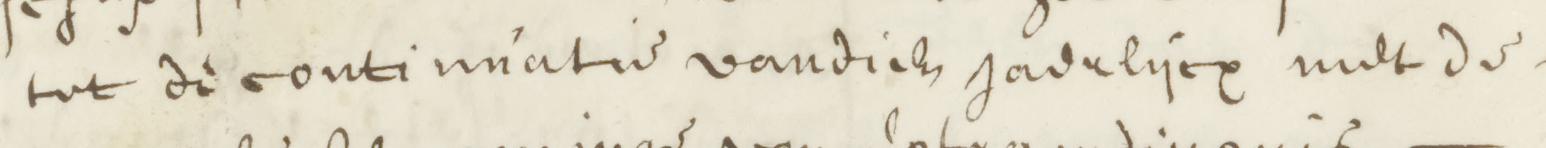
tot de continuatie vandien jaerlijcx met de
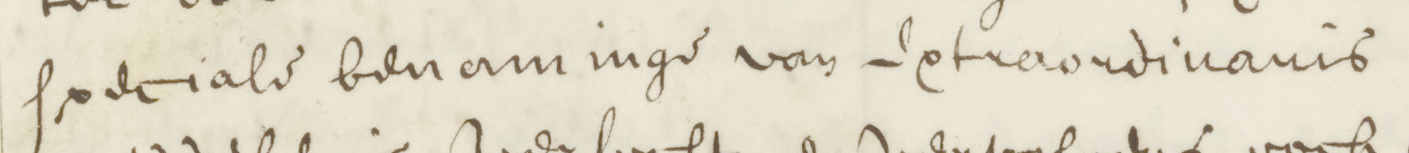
speciale benaminge van extraordinaris
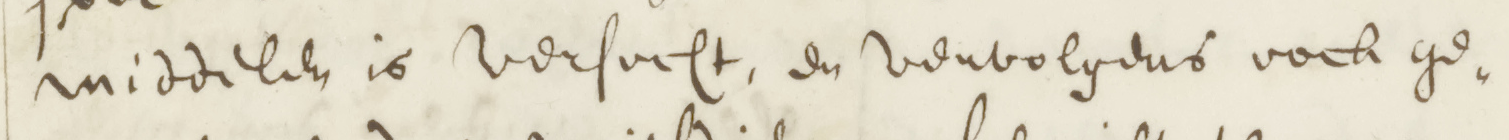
middelen is versocht, en vervolgens oock ge„
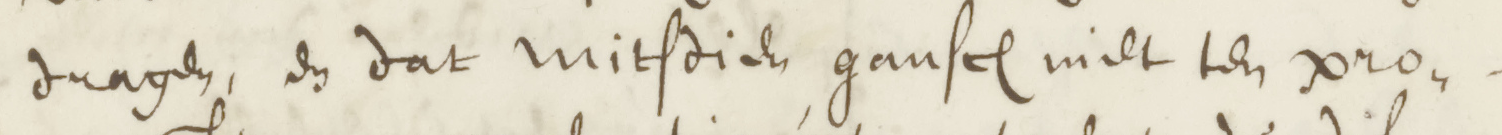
dragen, en dat mitsdien gansch niet ten pro„
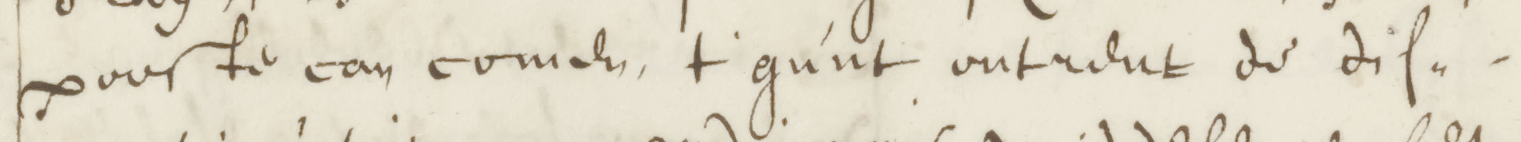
pooste can comen, t'gunt ontrent de dis„
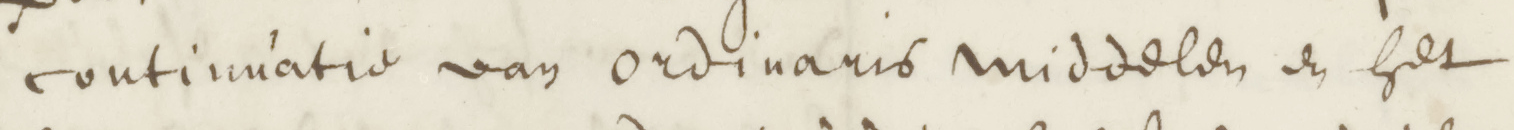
continuatie van ordinaris middelen en het
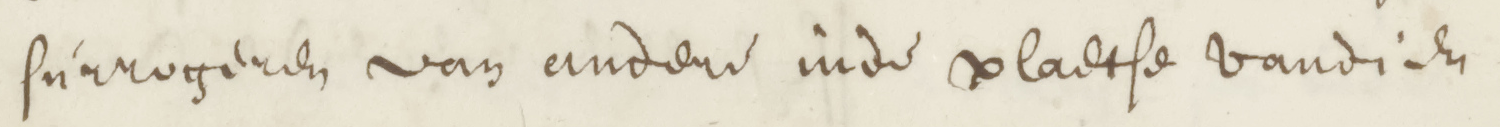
surrogeren van andere inde plaetse vandien
